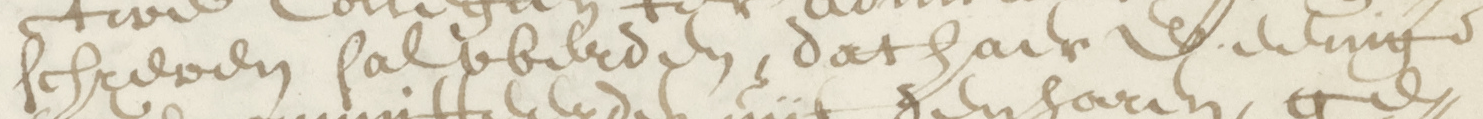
schreven sal werden, dat haer E. eenige
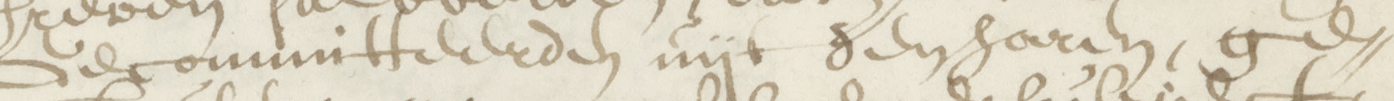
Gecommitteerden uijt den haren, ge,,
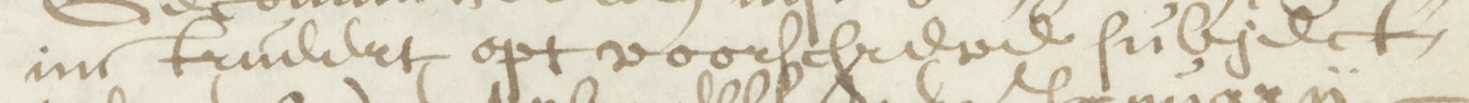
instrueert opt voorschreve subject,
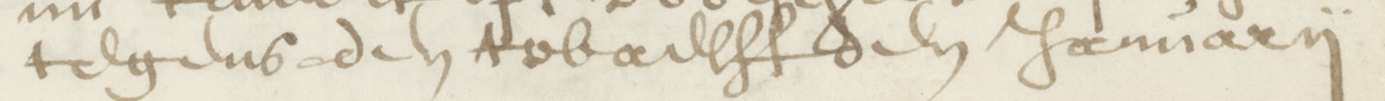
tegens den twaelffden Januarij
